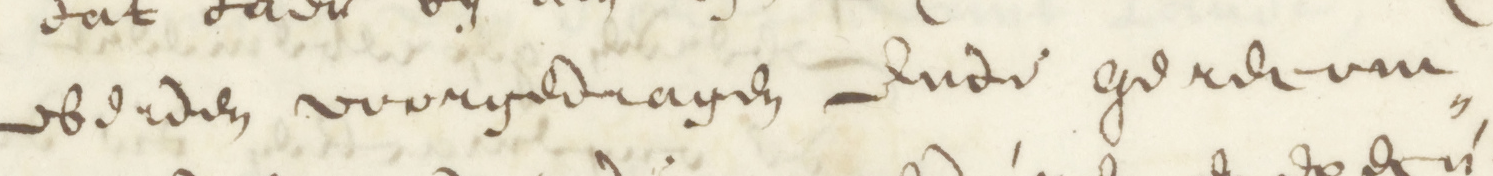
werden voorgedragen ende gerecom„
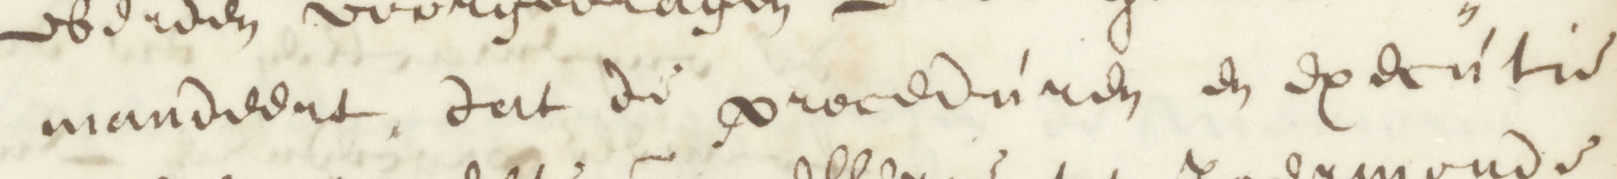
mandeert, dat de proceduren ende executie
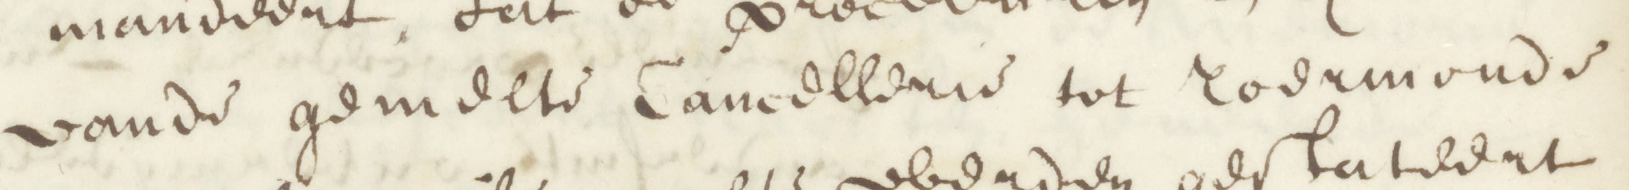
vande gemelte Cancellerie tot roermonde
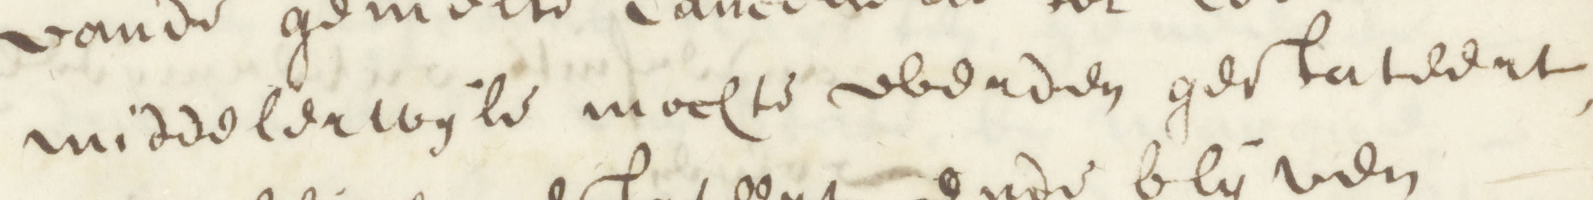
middelerwijls mochte werden gestateert
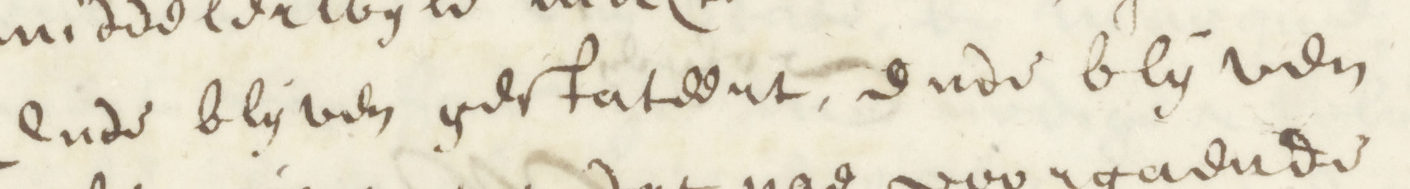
ende blijven gestateert ende blijven
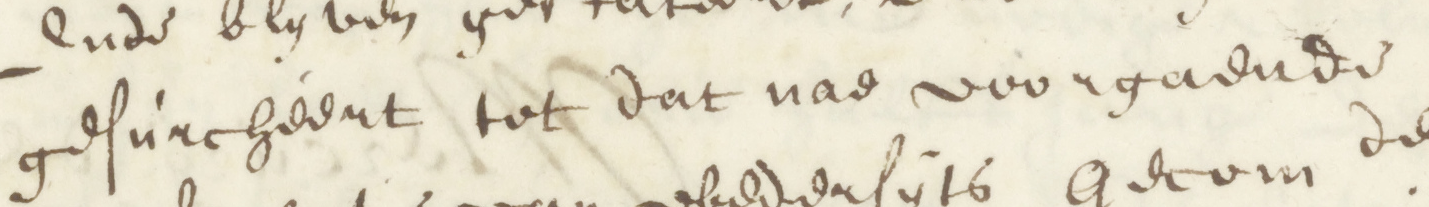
gesurcheert tot dat nae voorgaende
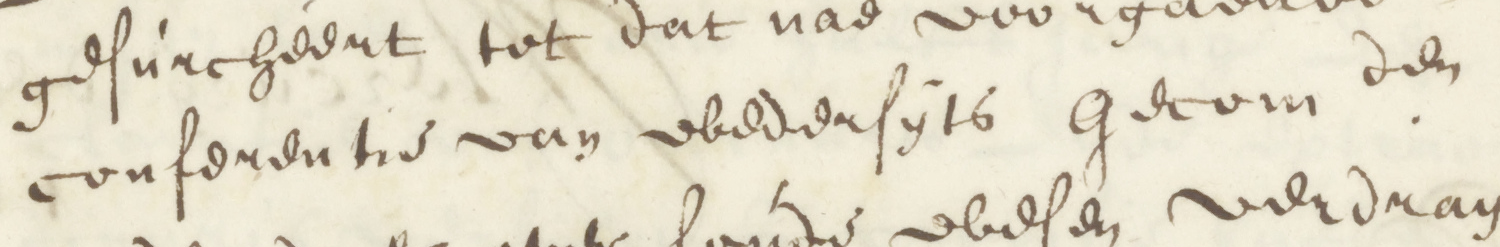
conferentie van wedersijts gecomden
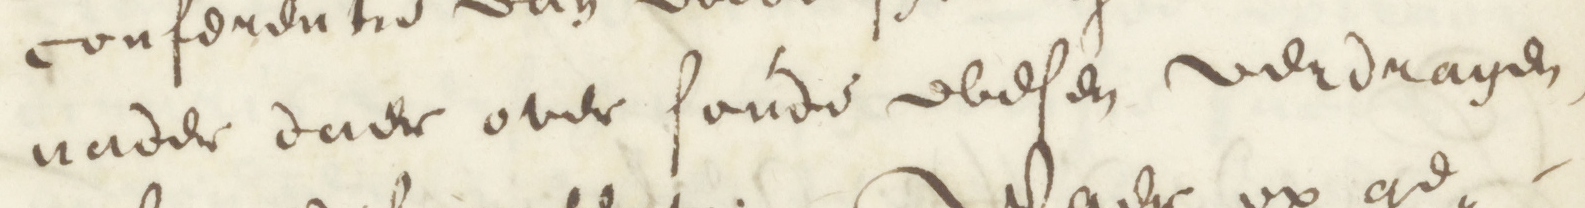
nader daer over soude wesen verdragen
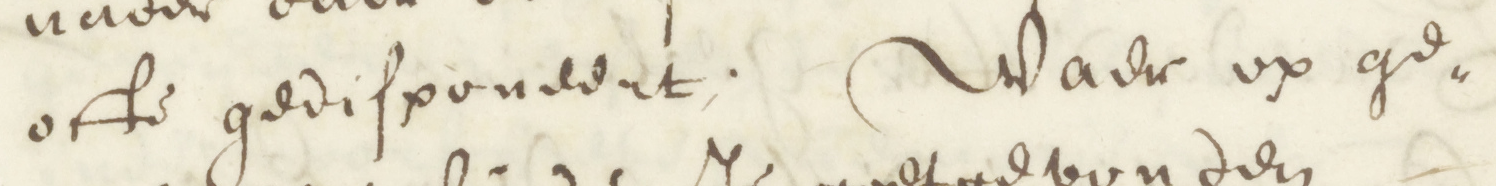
offte gedisponeert. Waer op ge„
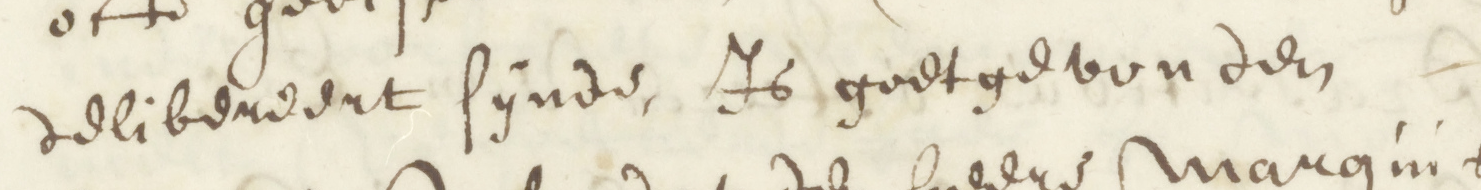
delibereert sijnde, Is goetgevonden
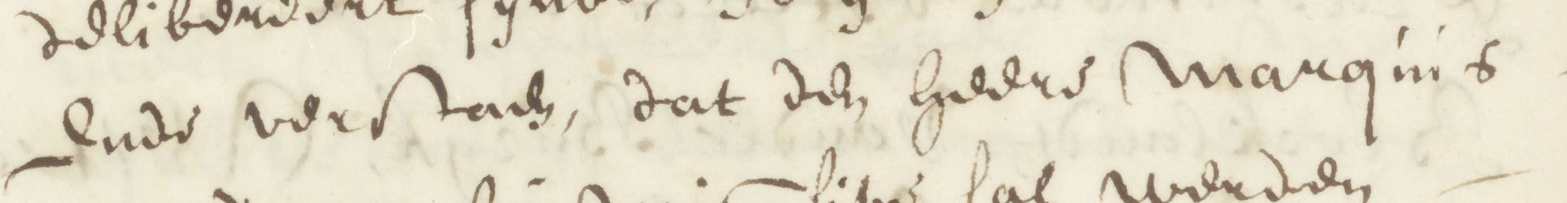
ende verstaen, dat de heere Marquis
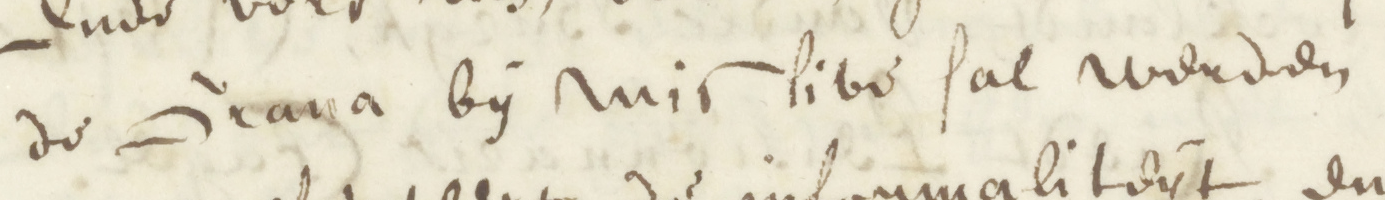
de Grana bij missive sal werden
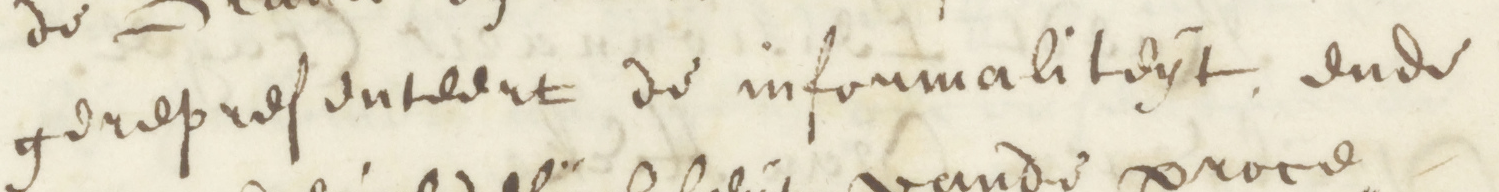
gerepresenteert de informaliteijt ende
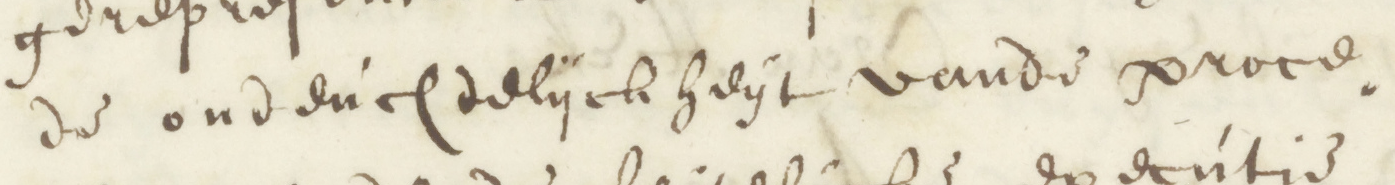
de ondeuchdelijckheijt vande proce„
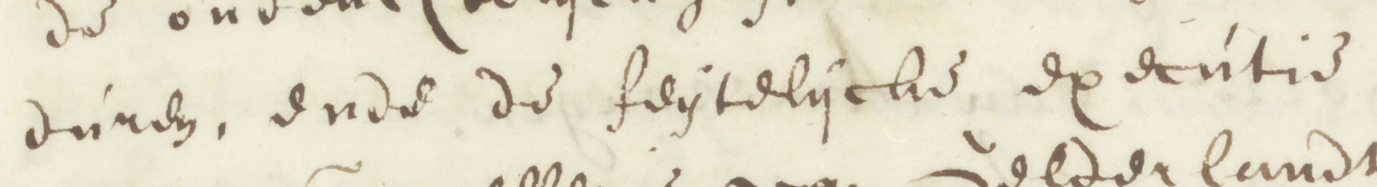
duren ende de feijtelijcke executie
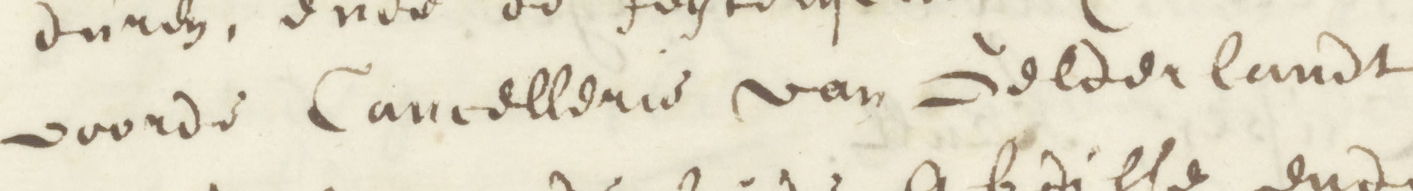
voorde Cancellerie van Gelderlandt
